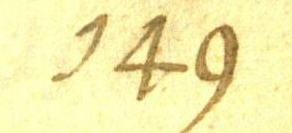149
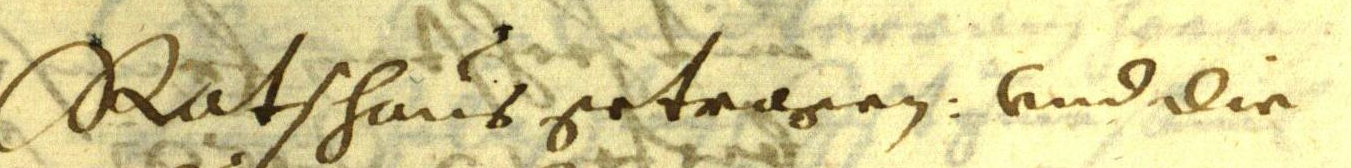Ratshaūs getragen: vnd die
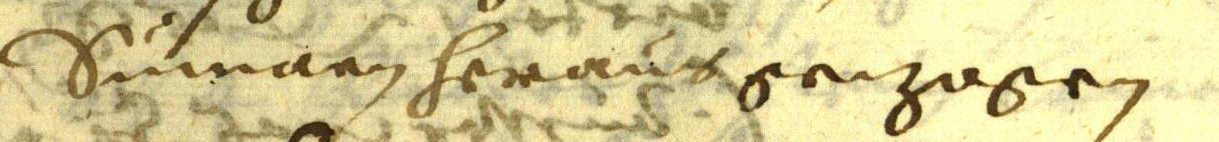Sūmarn heraūs getzogen
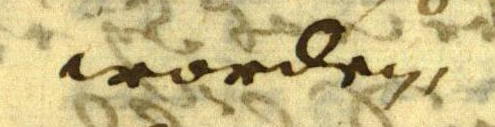worden,
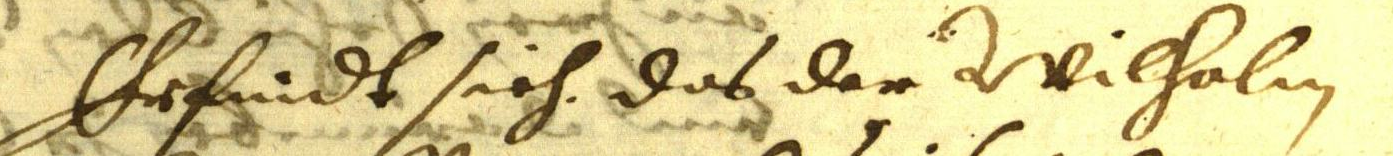Erfindt sich. das der Wilhalm
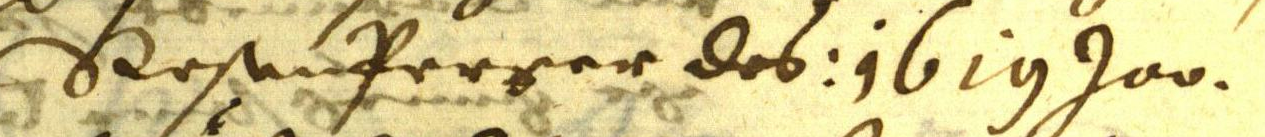ResenPerger des: 1619 Jar.
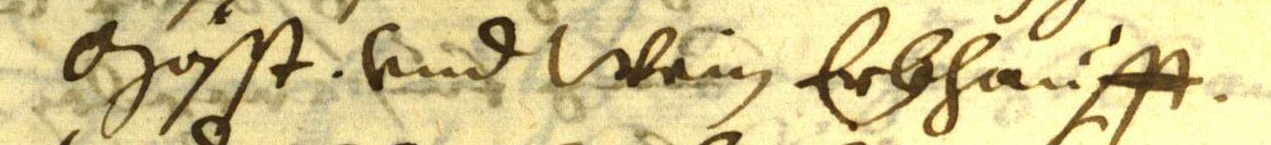Mōsst. vnd Wein Erkhaūfft.
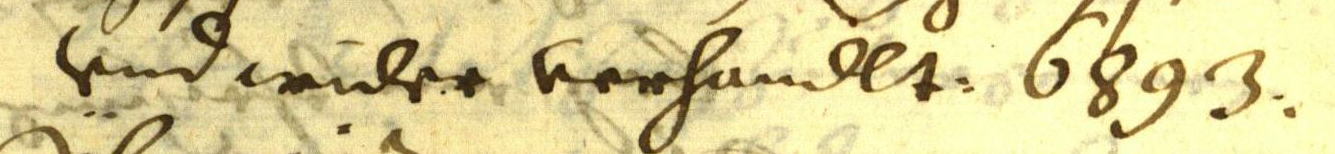vnd wider verhandlt: 6893:
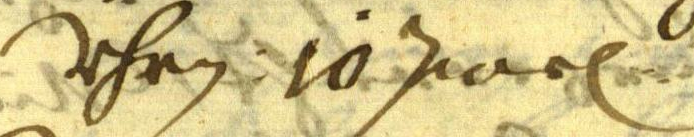v̈hrn: 10 Pac:
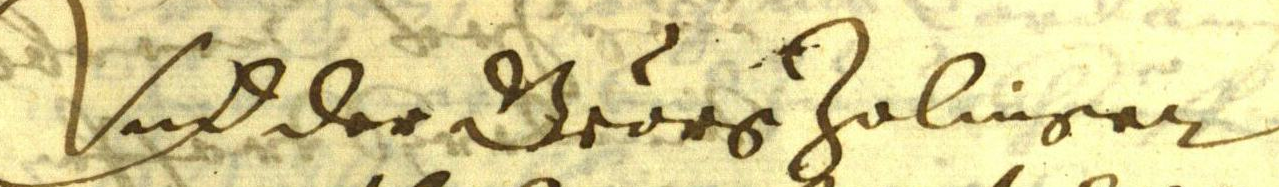Vnd der Geōrg Zalinger
